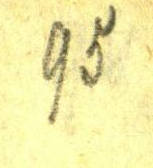95
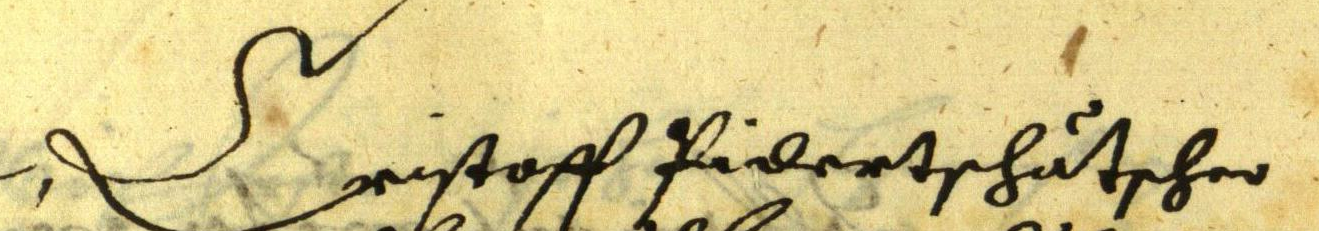Cristoff Pidertschātscher
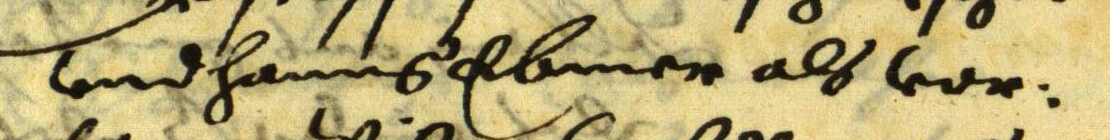vnd hanns Ebmer als vor¬
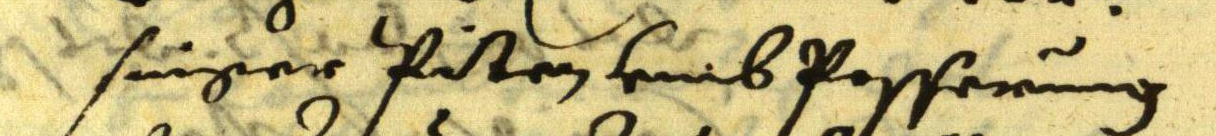singer Piten vmb Pesserūng
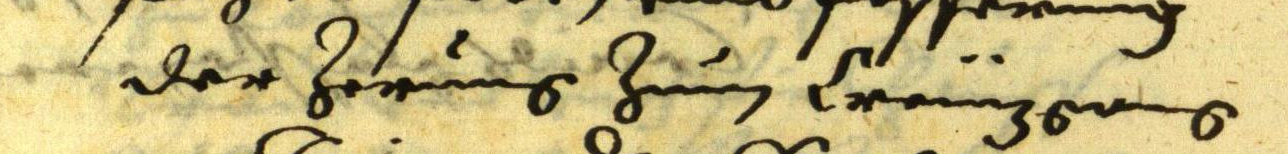der Zerūng Zūm Creüzgang
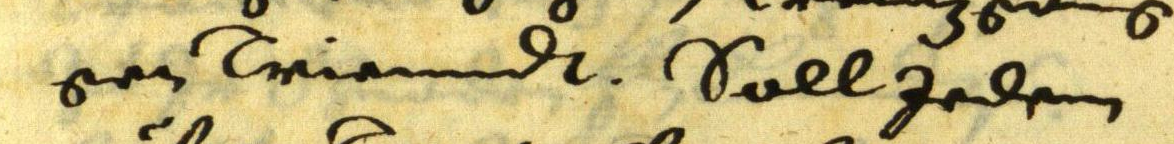gen Trienndt. Soll Jedem
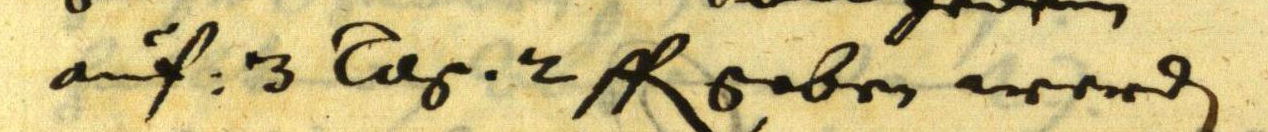aūf: 3 Tag .2 fl geben werd.
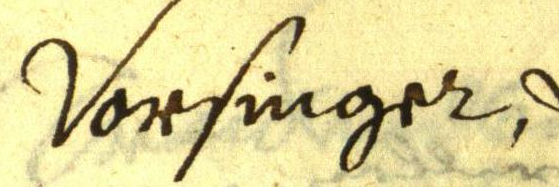Vorsinger,
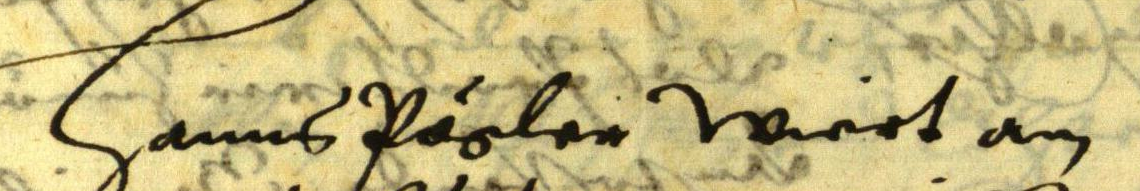Hanns Pāgler Wiert am
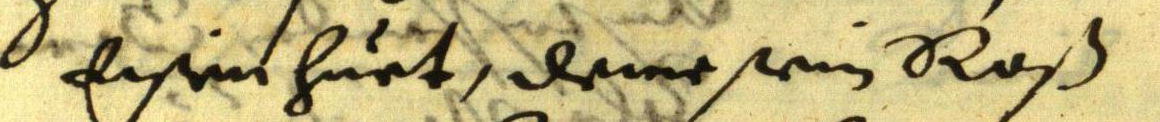Eisenhūet, deme sein Roß
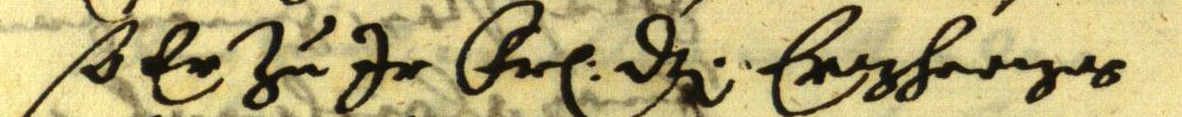So Er Zū Ir Frl: dt: Erzherzog
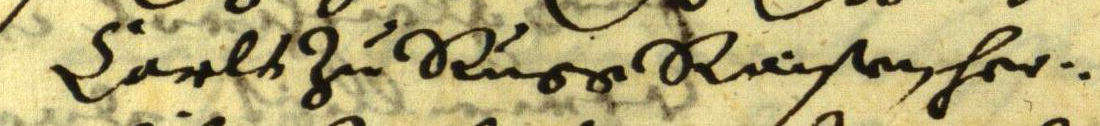Carls Zū Rūgg Raisen her¬
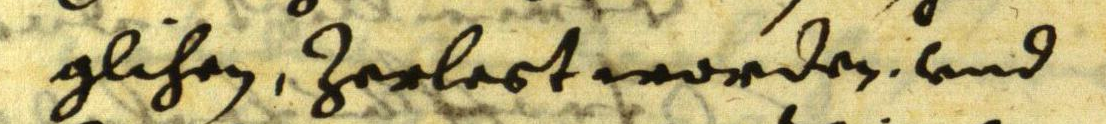glihen, Zerlegt worden. vnd
